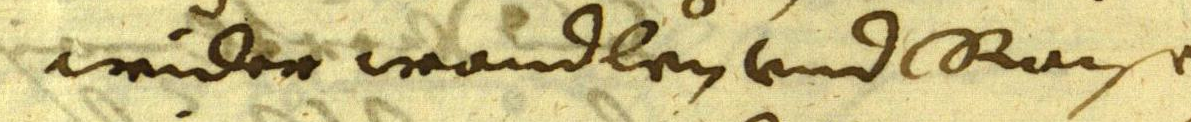wider wandlen vnd Raisen
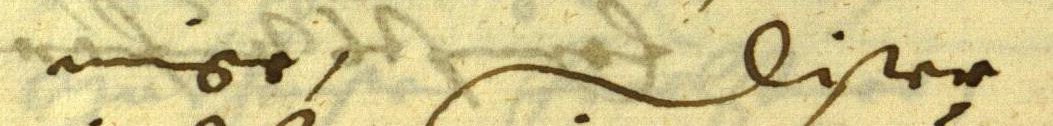mige, Diser
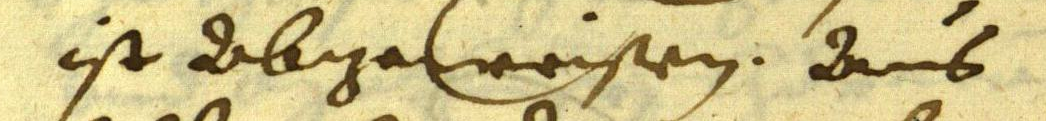ist Abzeweisen. Aūs
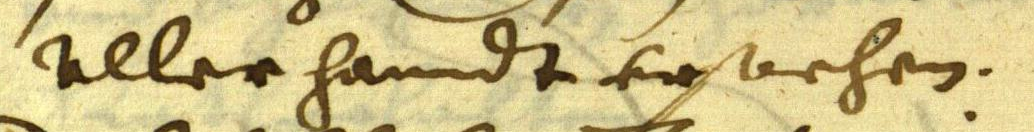Aller handt vrsachen.
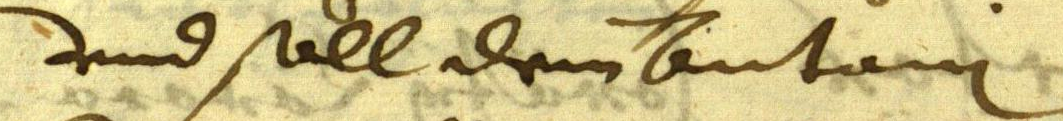vnd soll dem Antonj
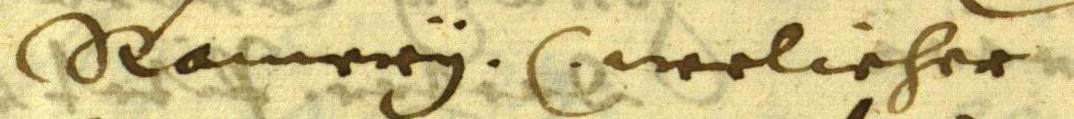Romerÿ .(.welicher
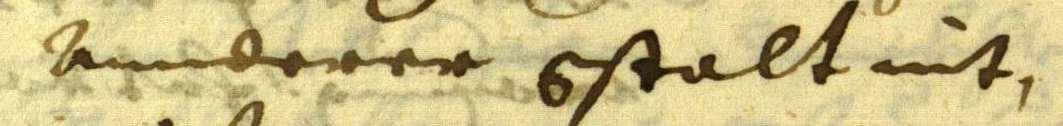Annderer gstalt nit,
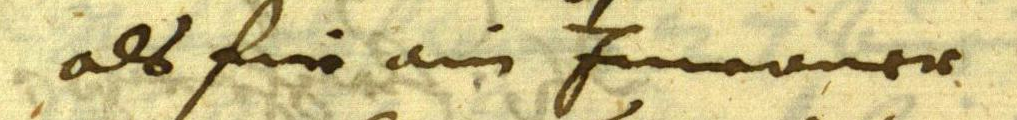als fir ain Inwoner
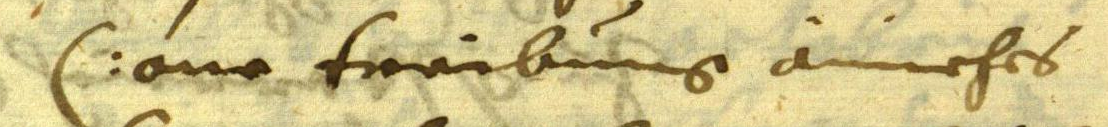(:one treibūng ainiches
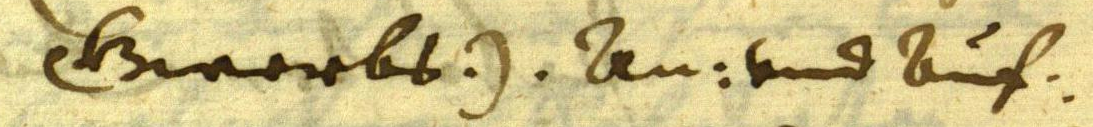Gwerbs.). An: vnd Aūf¬
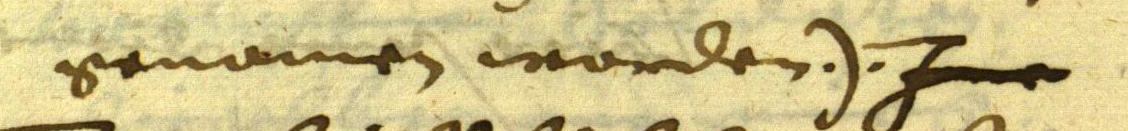genomen worden.). Ime
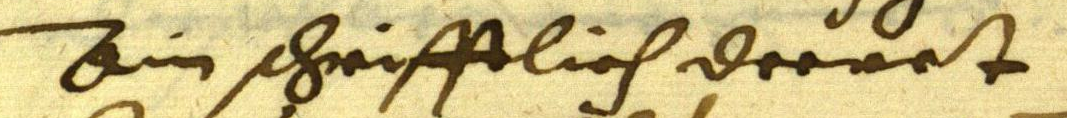Ain schrifftlich decret
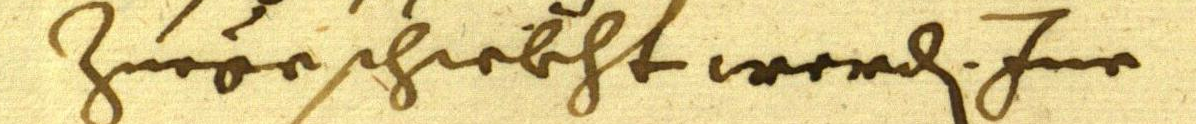Zūegeschickht werd. Ine
